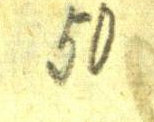50
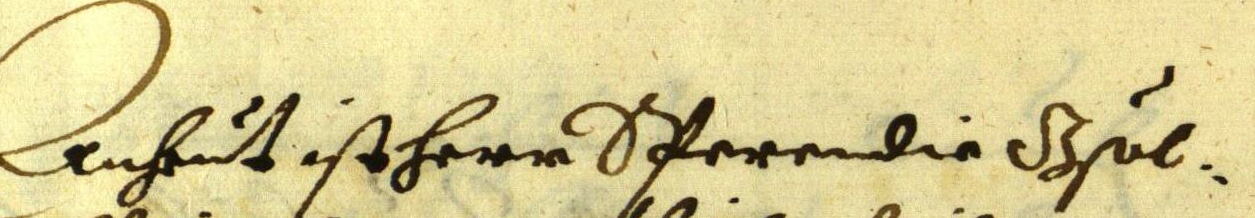Anheūt ist herr Sperendie Gsōl¬
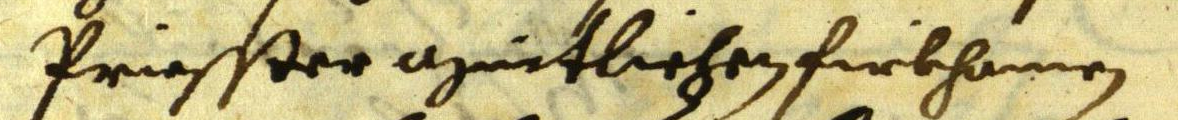Priesster mintlichen firkhomen
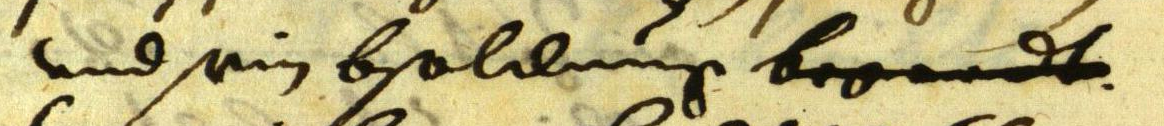vnd sein bsoldūng begerdt
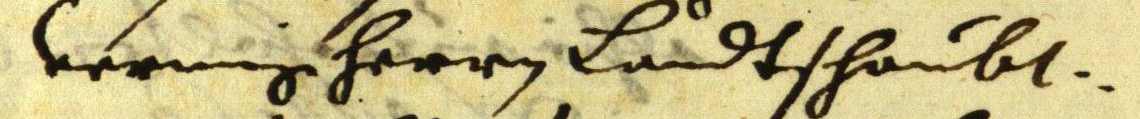vermig herrn Landthaūbt¬
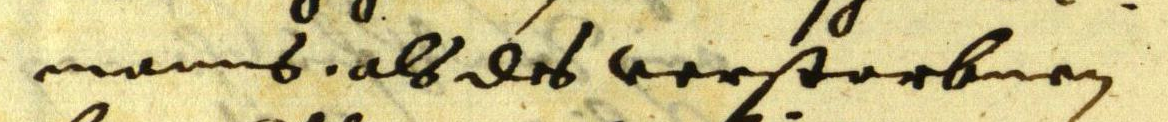manns. als des verstorbnen
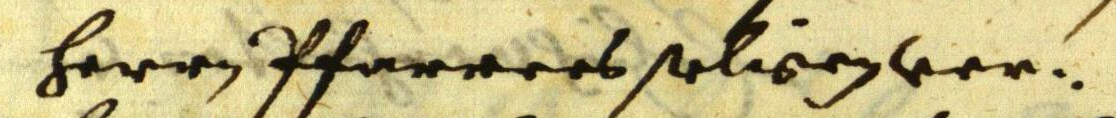herrn Pfarrers seligen ver¬
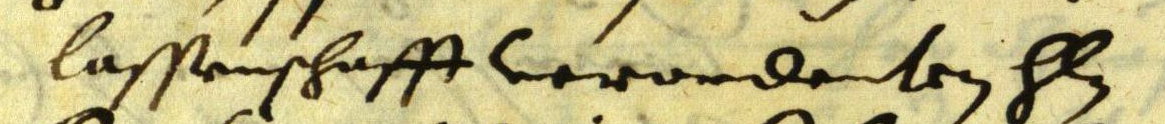lassenschafft verordenten hln
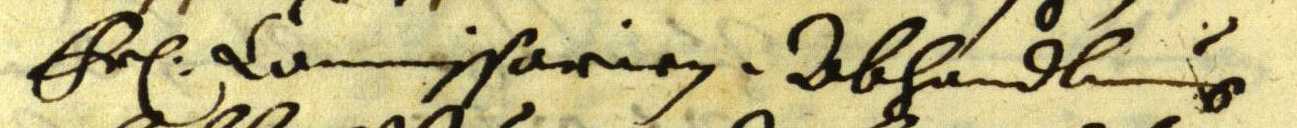Frl: Commissarien. Abhandlūng
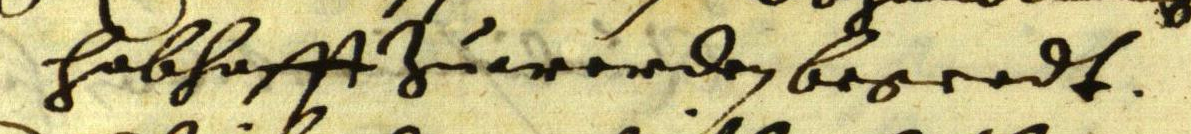habhafft Zū werden begerdt.
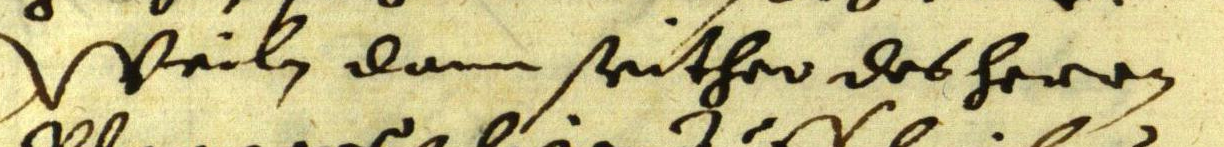Weiln dann seither des herrn
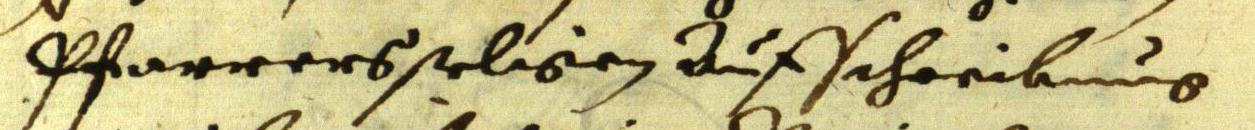Pfarrers seligen Aūfschreibūng
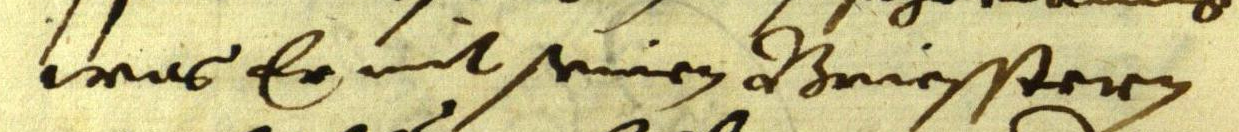was Er mit seinen Briesstern
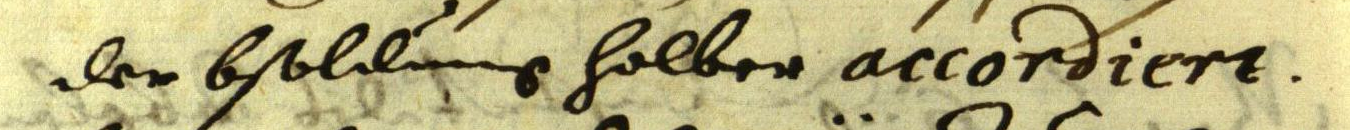der besoldūng halber accordiert.
